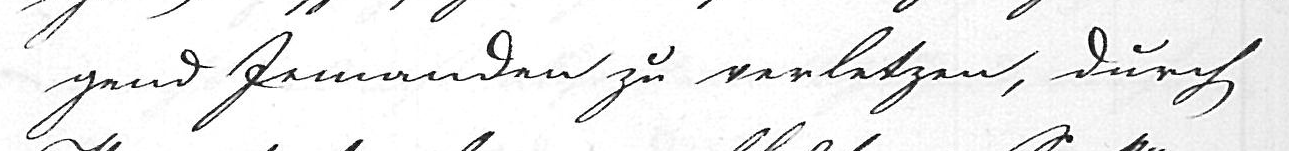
gend Jemanden zu verletzen, durch
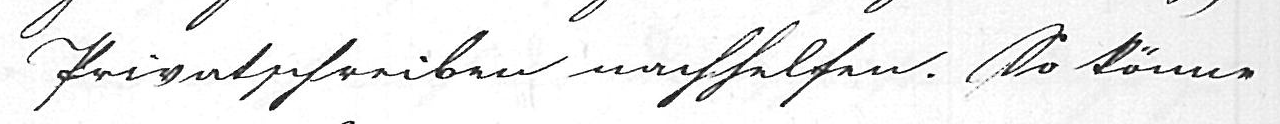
Privatschreiben nachhelfen. So könne
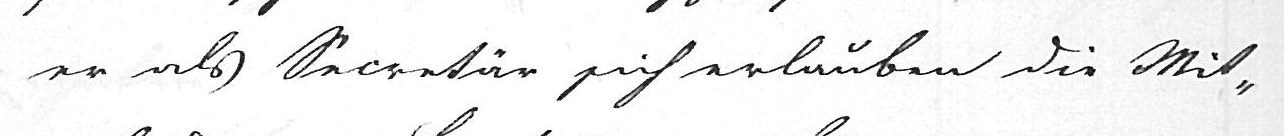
er als Secretär sich erlauben die Mit-
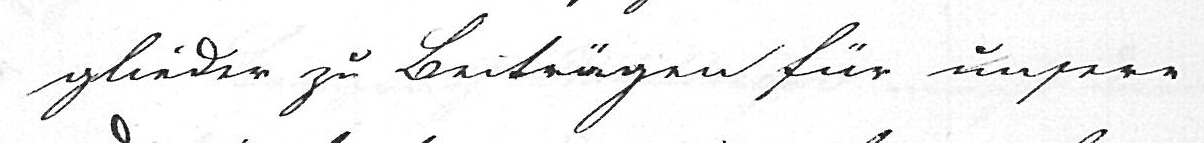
glieder zu Beträgen für unsere
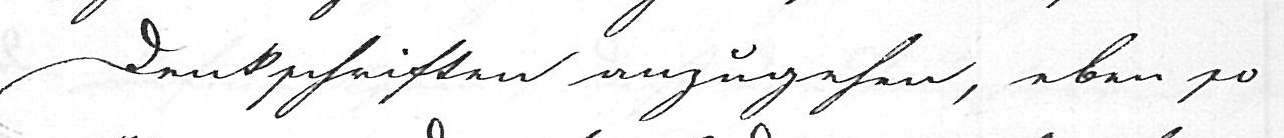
Druckschriften anzugehen, eben so
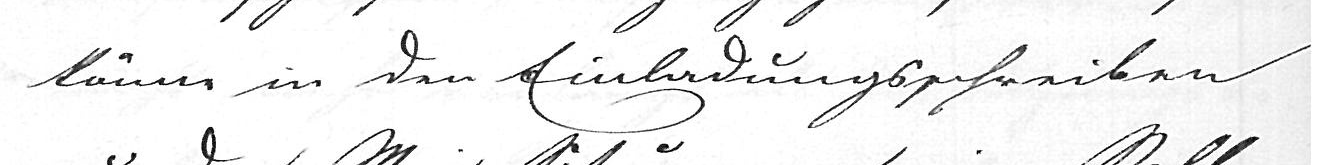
könne in den Einladungsschreiben
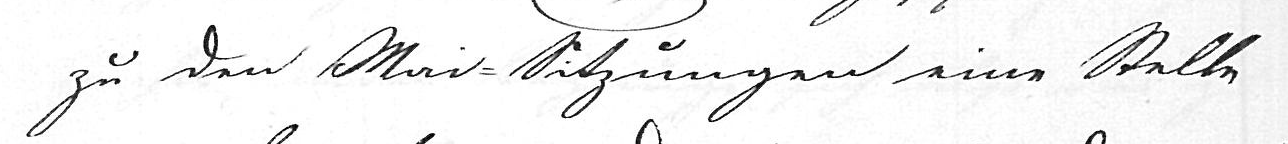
zu den Mai-Sitzungen eine Stelle
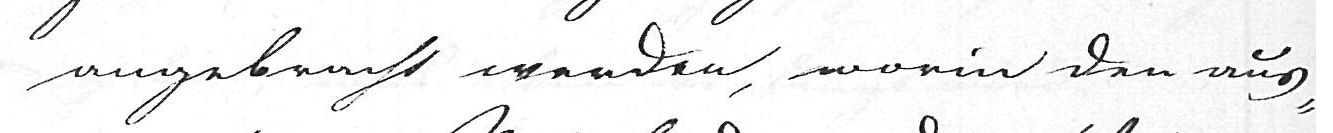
angebracht werden, worin den aus-
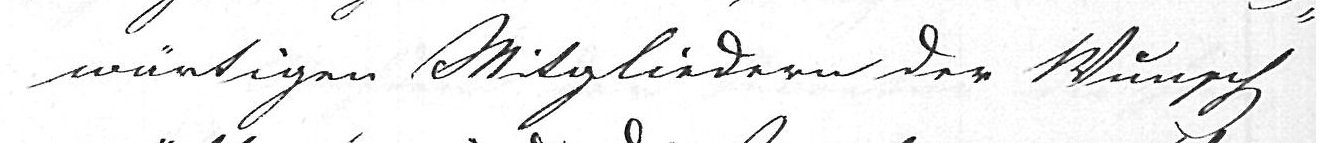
wärtigen Mitgliedern der Wunsch
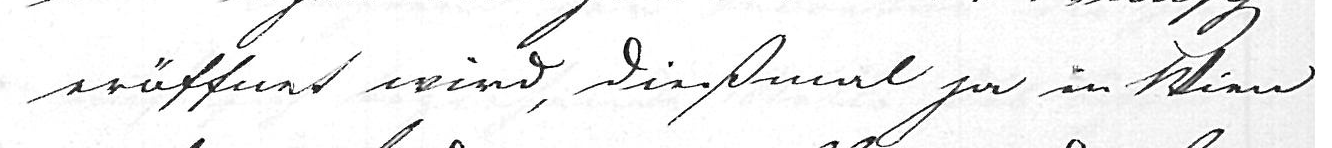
eröffnet wird, dießmal ja in Wien
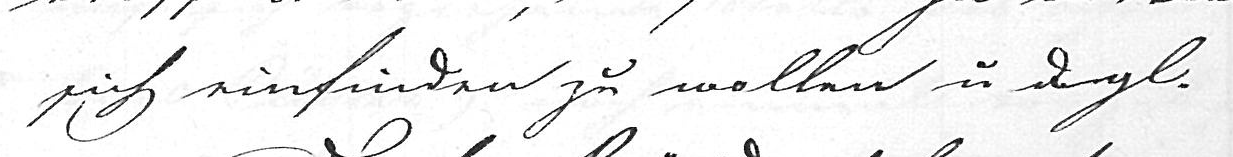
sich einfinden zu wollen u dgl.
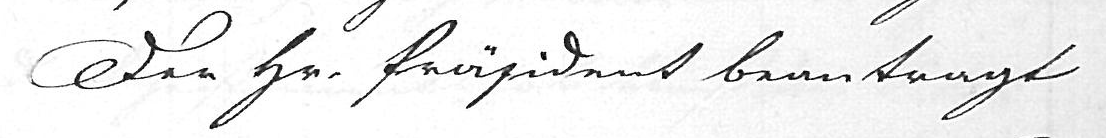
Der Hr. Präsident beantragt
